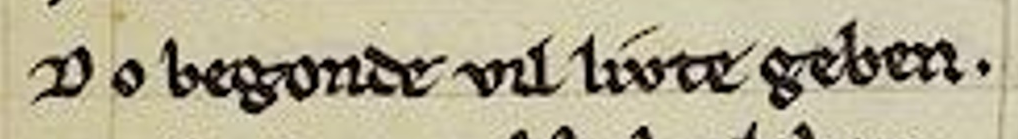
Do begonde vil livte geben.
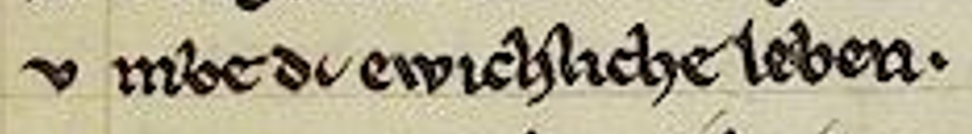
Vmbe d(az) ewichliche leben.
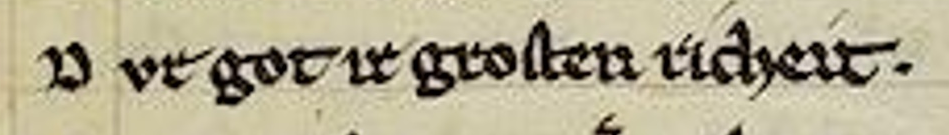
Dvr got ir groſten richeit.
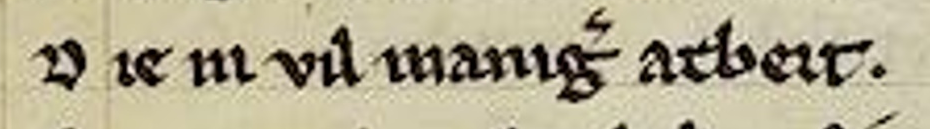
Die in vil manig(er) arbeit.
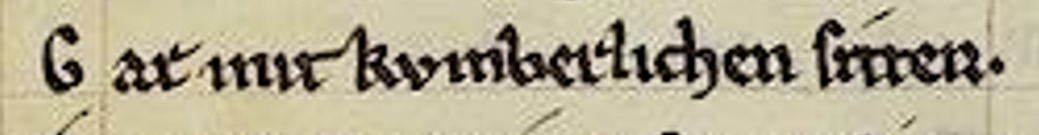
Gar mit kvmberlichen ſitten.
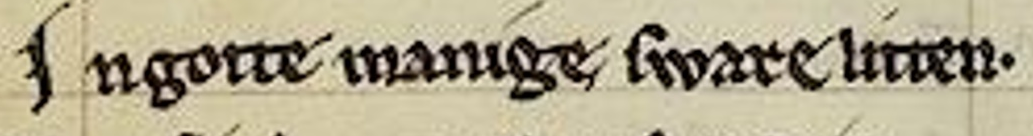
Ingotte manige ſware litten.
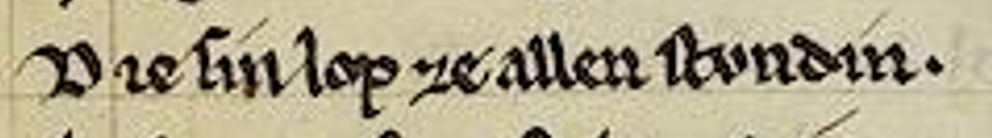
Die ſin lop ze allen ſtvndin.
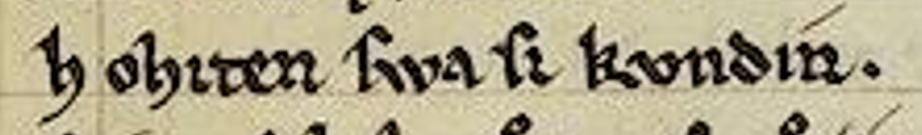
Hohiten ſwa ſi kvndin.
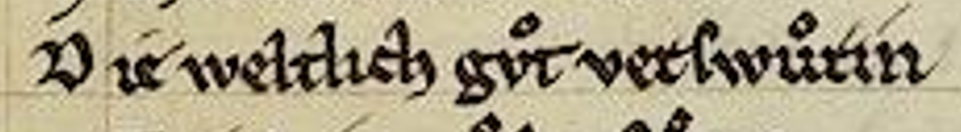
Die weltlich gv°ot verſwu°orin
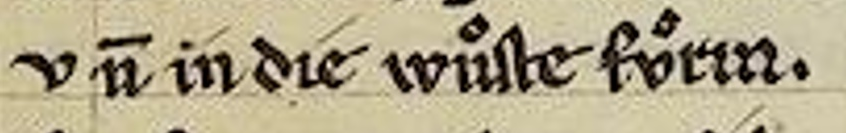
Vn(d) in die wu°oſte fv°orin.
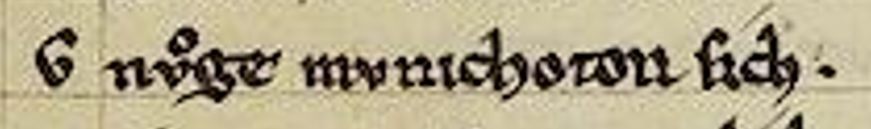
Gnv°oge mvnichoton ſich.
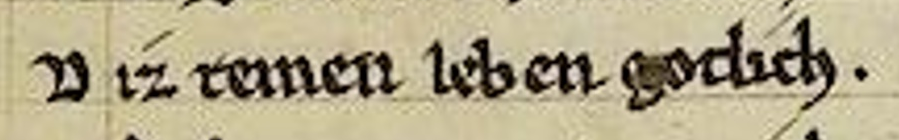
Diz reinen leben gotlich.
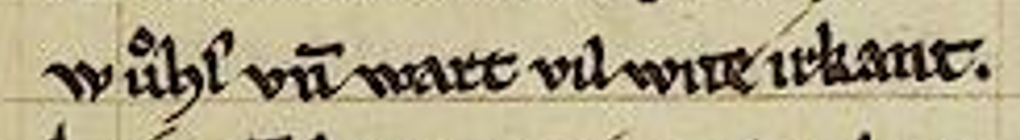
wu°ohſ vn(d) wart vil wite irkant.
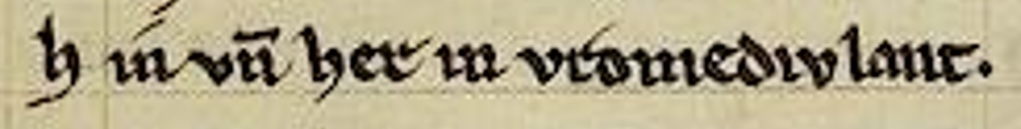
Hin vn(d) her in vromediv lant.
